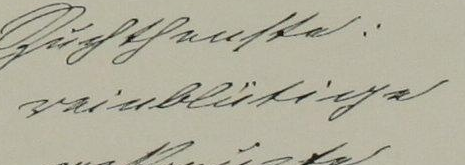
reinblütige
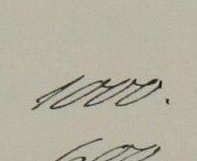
1000
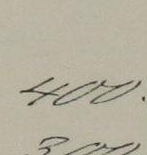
400
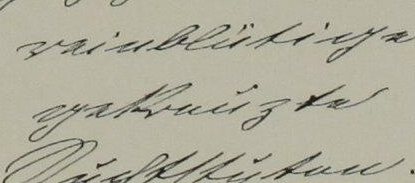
gekreuzte
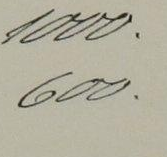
600
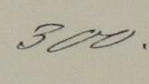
300
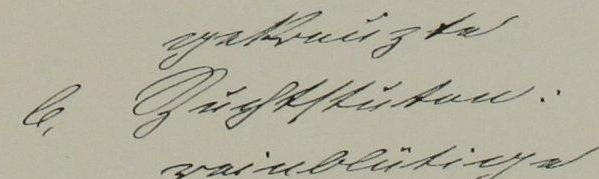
b. Zuchtstuten:
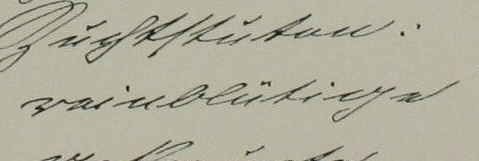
reinblütige
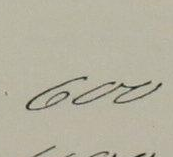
600
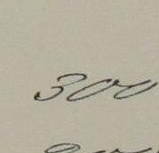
300
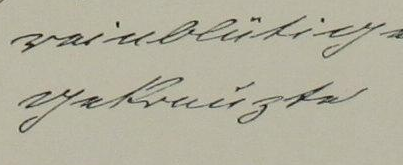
gekreuzte
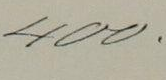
400
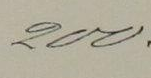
200
